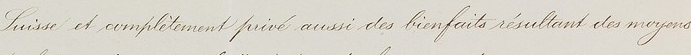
Suisse et complètement privé aussi des bienfaits résultant des moyens
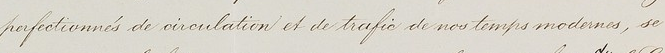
perfectionnés de circulation et de trafic de nos temps modernes, se
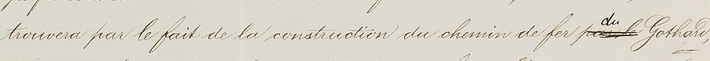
trouvera par le fait de la construction du chemin de fer par leduGothard,
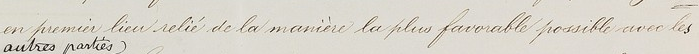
en premier lieu relié de la manière la plus favorable possible avec les
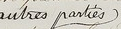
autres parties
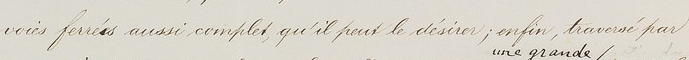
voies ferrées aussi complet, qu'il peut le désirer; enfin, traversé par
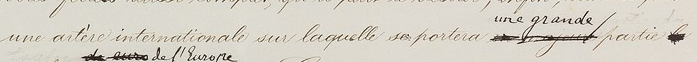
une artère internationale sur laquelle se portera une majeureune grande partie du
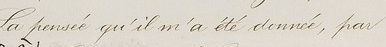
La pensée qu'il m'a été donnée, par
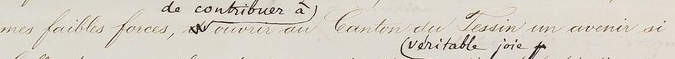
mes faibles forces, d'de contribuer à ouvrir au Canton du Tessin un avenir si
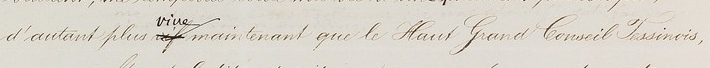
d'autant plus vifvive maintenant que le Haut Grand Conseil Tessinois,
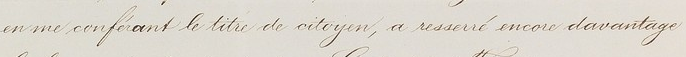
en me conférant le titre de citoyen, a rassuré encore davantage
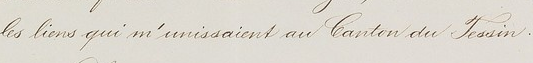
les liens qui m'unissaient au Canton du Tessin.
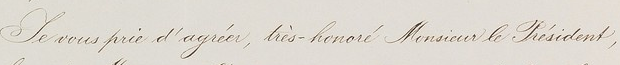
Je vous prie d'agréer, très-honoré Monsieur le Président,
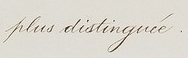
plus distinguée.
